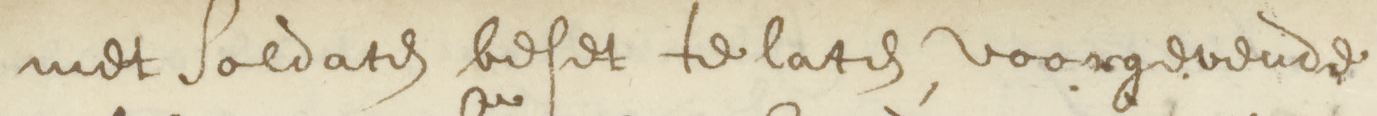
met Soldaten beset te laten, voorgevende
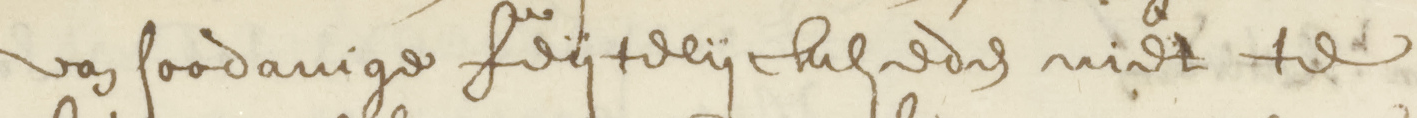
van soodanige feijtelijckheden niet te
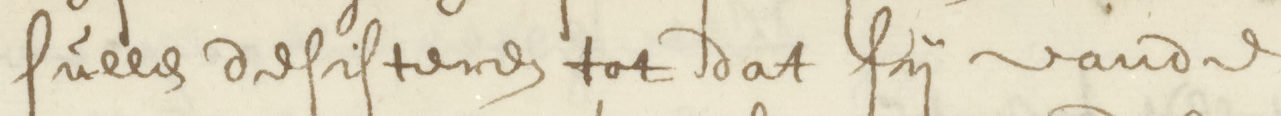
sullen desisteren tot dat sij vande
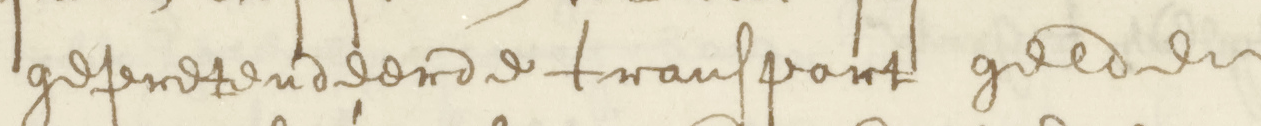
gepretendeerde transport gelden
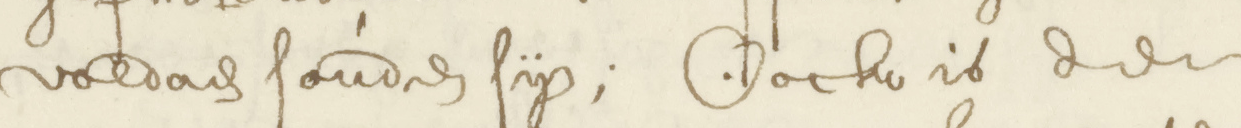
voldaen souden sijn; Oock is den
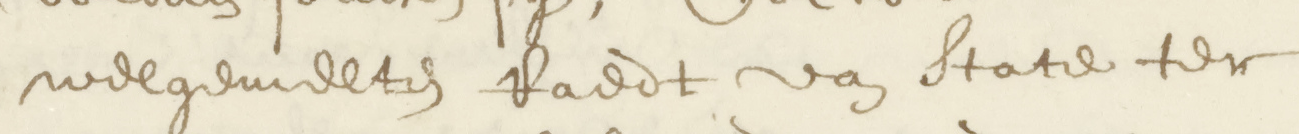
welgemelten Raedt van State ter
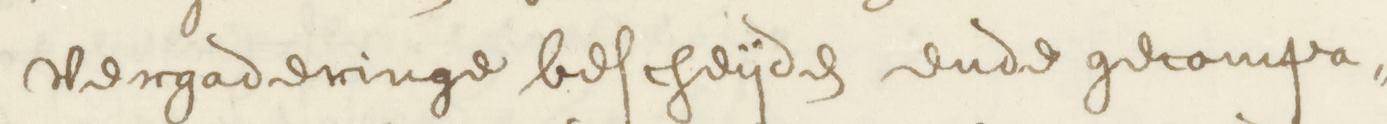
Vergaderinge bescheijden ende gecompa„
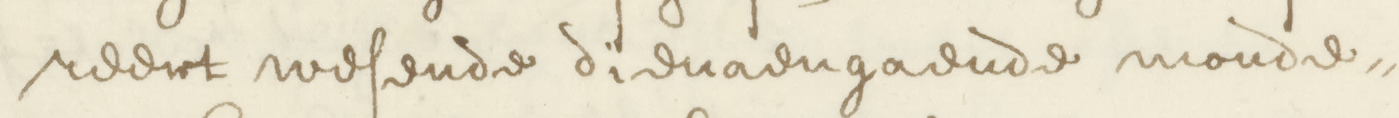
„reert wesende dienaengaende monde„
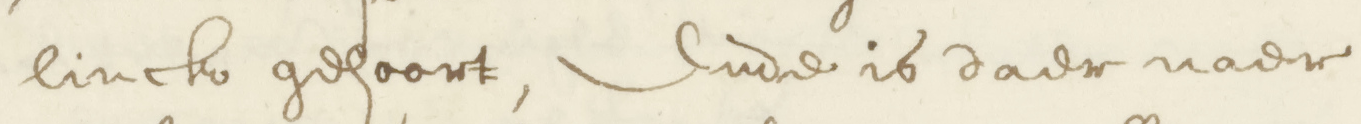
linck gehoort, Ende is daer naer
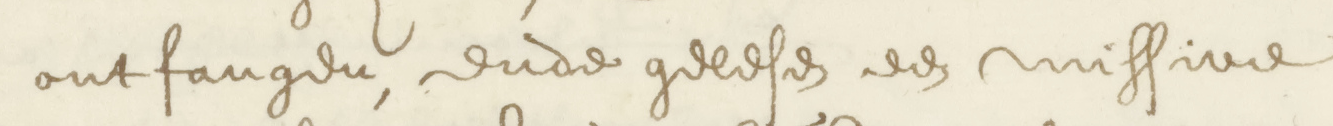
ontfangen, ende gelesen een missive
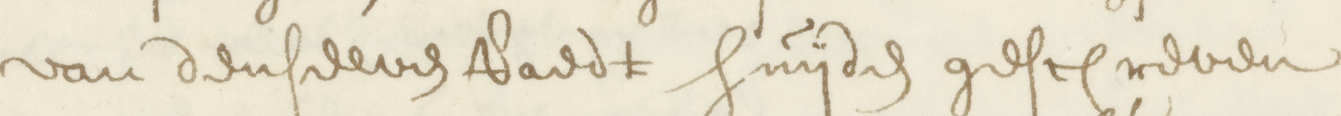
van denselven Raedt huijden geschreven
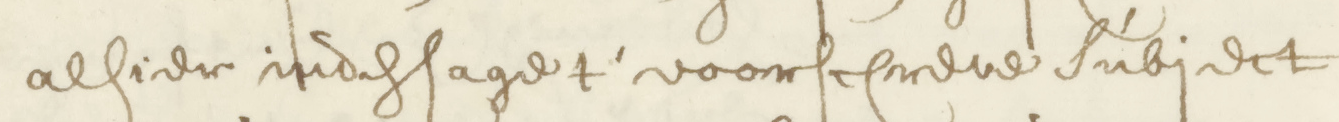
alhier inde hage t' voorschreve Subject
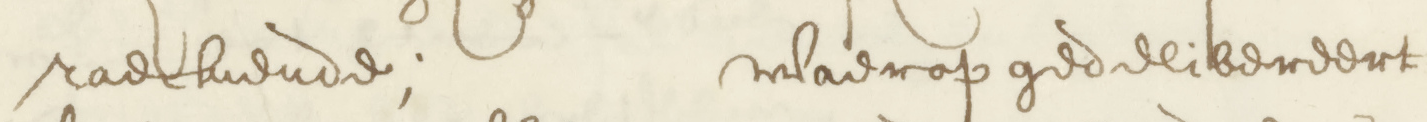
raeckende; Waerop gedelibereert
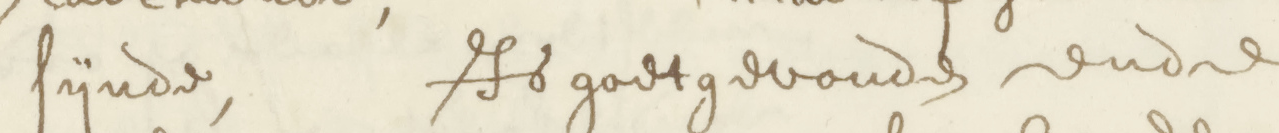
sijnde, Is goetgevonden ende
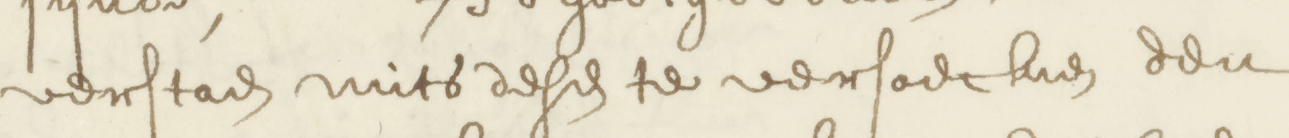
verstaen mits desen te versoecken den
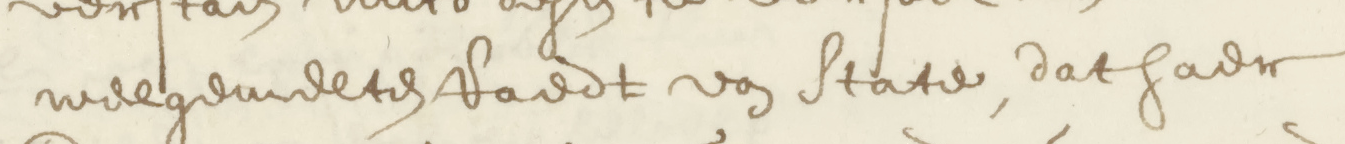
welgemelten Raedt van State, dat haer
